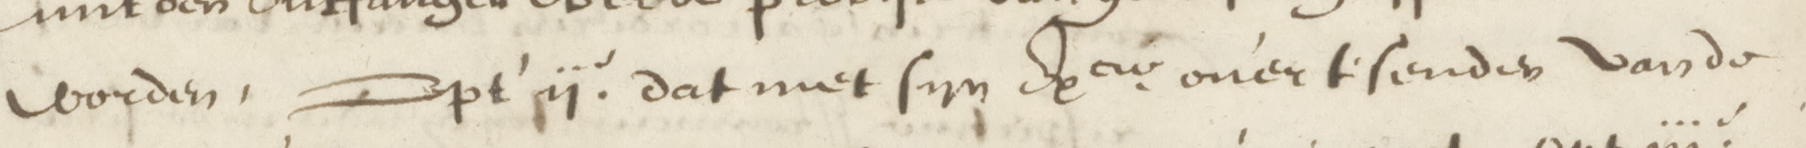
worden. Opt' iie. dat met syn Excie ouer t'senden van de
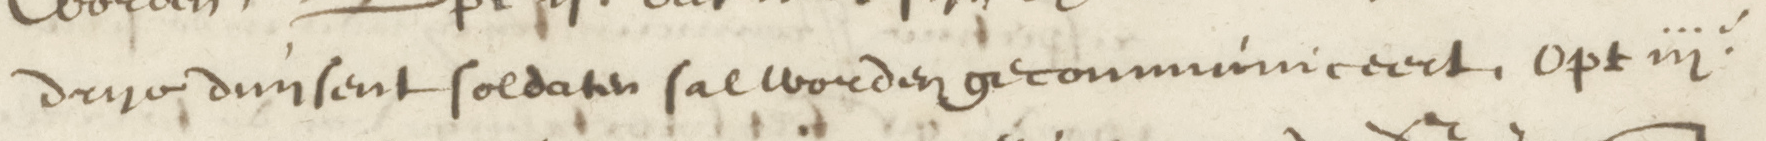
drye duysent soldaten sal worden gecommuniceert, Opt iije.
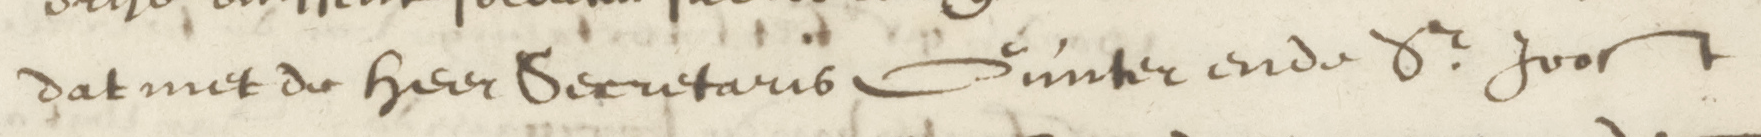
dat met de heer Secretaris Gunter ende Sr. Joost
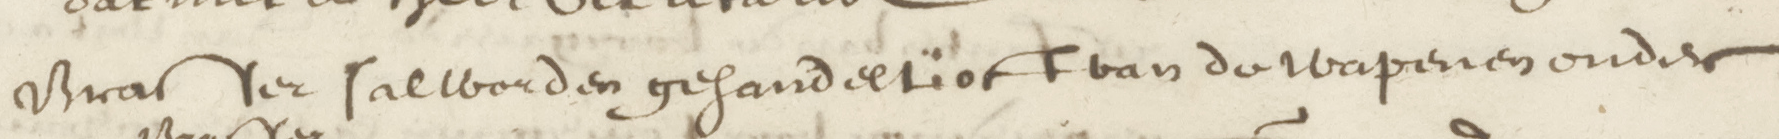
Brasser sal worden gehandelt off van de wapenen onder
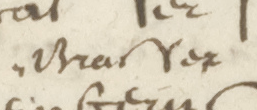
,,Brasser,,
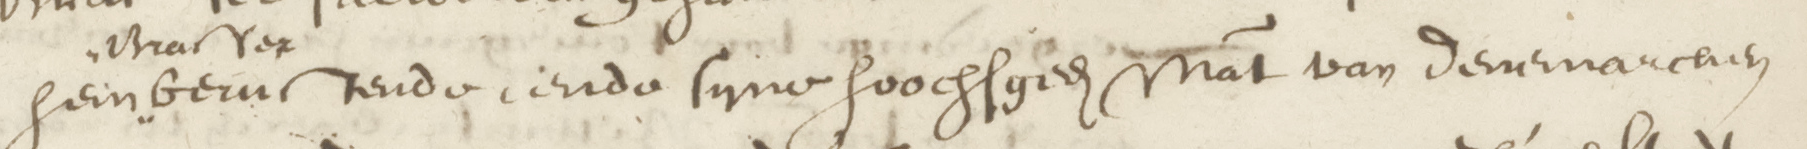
hem ,, berustende, ende syne hoochsged Mat van Denemarcken
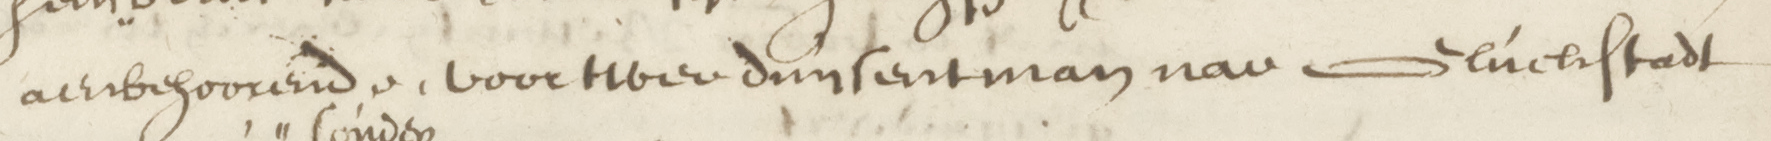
aenbehoorende, voor twee duysent man nae Gluckstadt
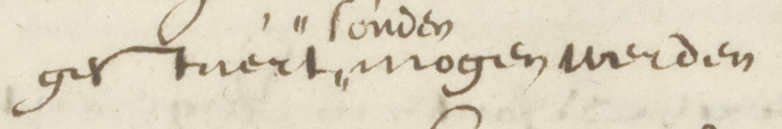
gestuert ,,souden mogen werden.
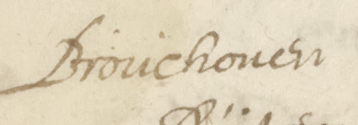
Brouchouen
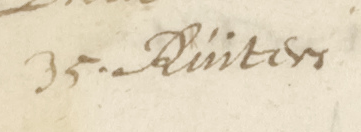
35. Ruiters
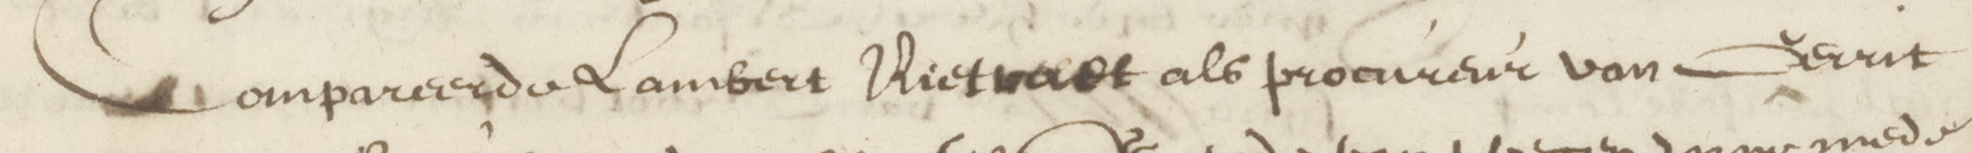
Compareerde Lambert Rietraet als procureur van Gerrit
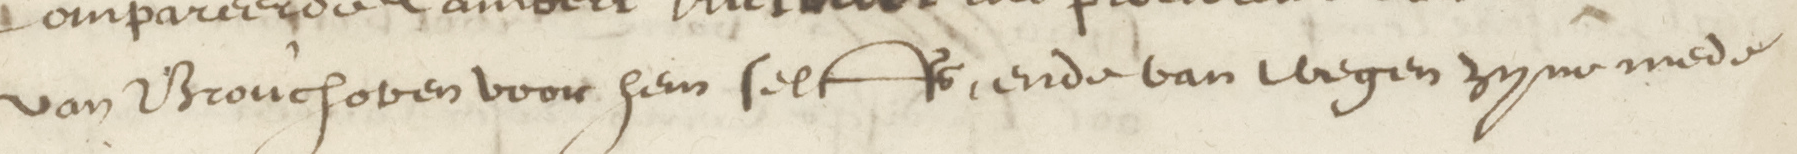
van Brouchoven voor hem selffs, ende van wegen zyne mede
